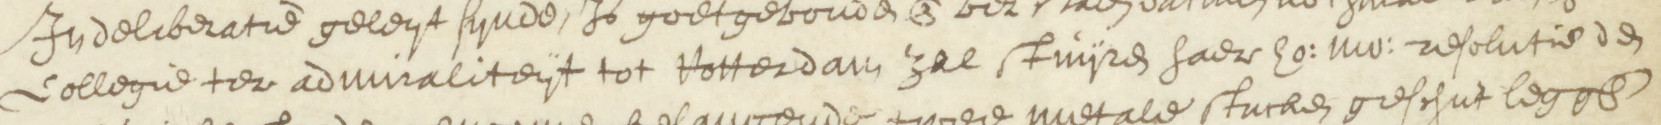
Collegie ter admiraliteyt tot Rotterdam zal stuijren haer ho:mo: resolutie den
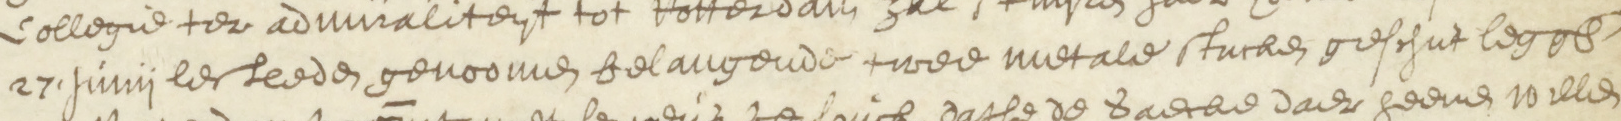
27. junij lestleden genoomen belangende twee metale stucken geschut legge
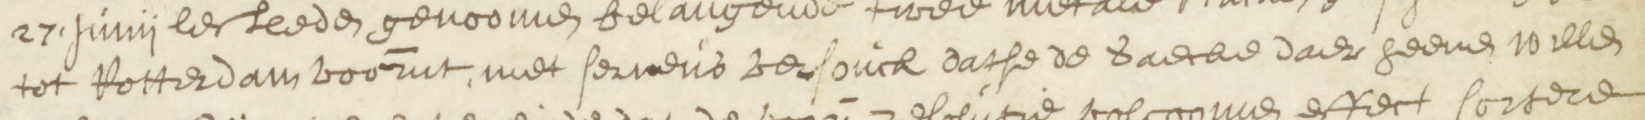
tot Rotterdam voornt, met serieus versouck datse de saecke daer heenen willen
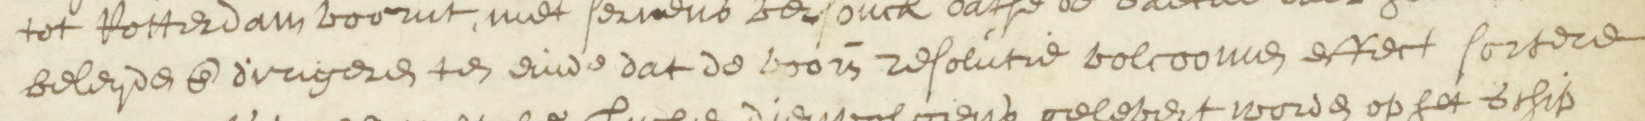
beleyden & dirigeren ten einde dat de voorn resolutie volcoomen effect sortere
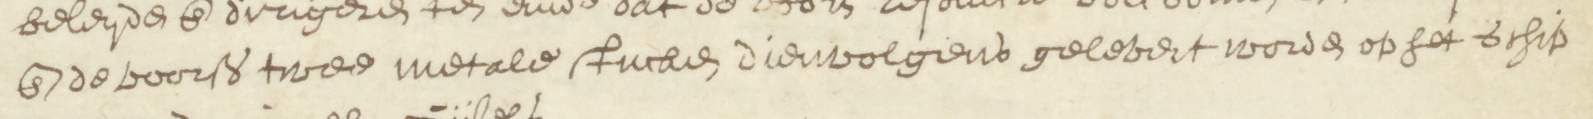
& de voors twee metale stucken dienvolgens gelevert worden op het schip
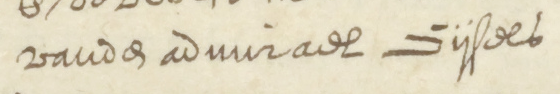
vanden admirael Gijsels
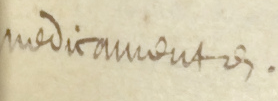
medicamenten.
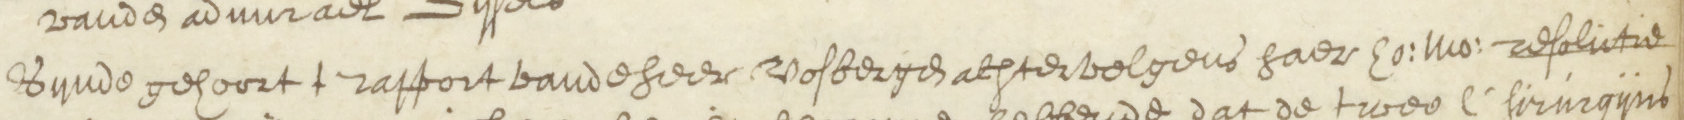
Synde gehoort t rapport vande heer Vosbergen achtervolgens haer ho:Mo: resolutie
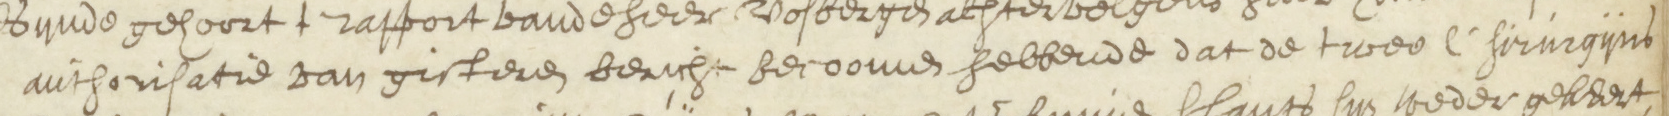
authorisatie van gisteren bericht becoomen hebbende dat de twee Chirugijns
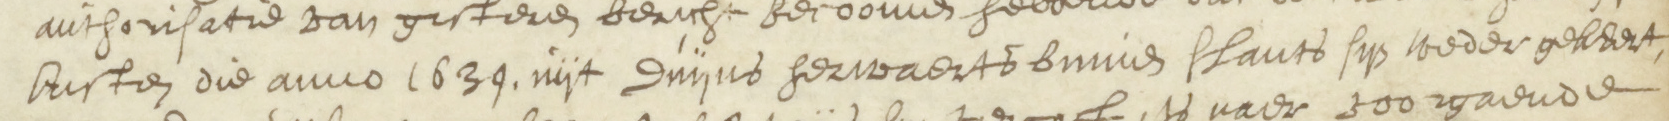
kisten die anno 1639. uijt Duijns herwaerts binnen sLants syn weder gekeert,
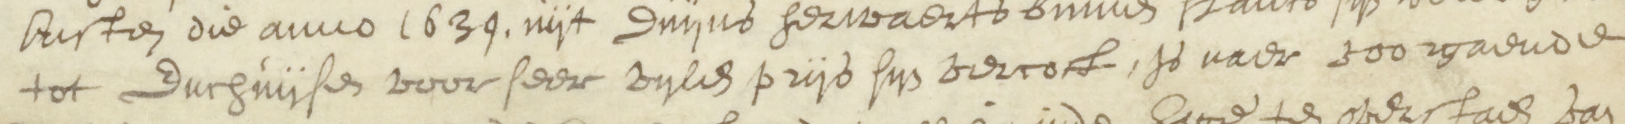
tot Enchuijsen voor seer vylen prijs syn vercoft, Is naer voorgaende
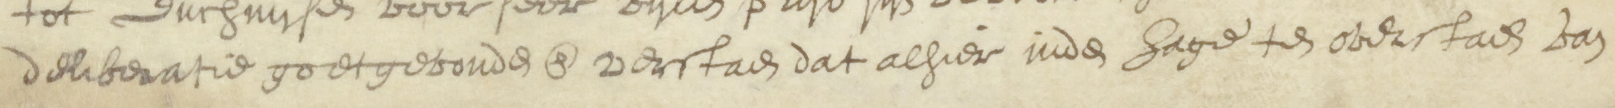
deliberatie goetgevonden & verstaen dat alhier inde Hage ten overstaen van
